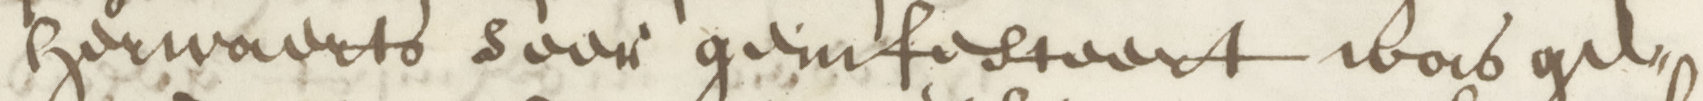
herwaerts seer geinfesteert was ge,,
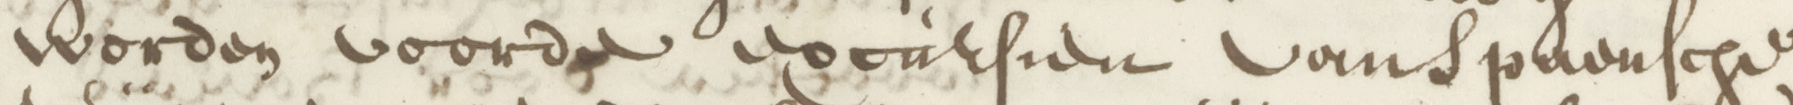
„worden voorde excursien van spaensche
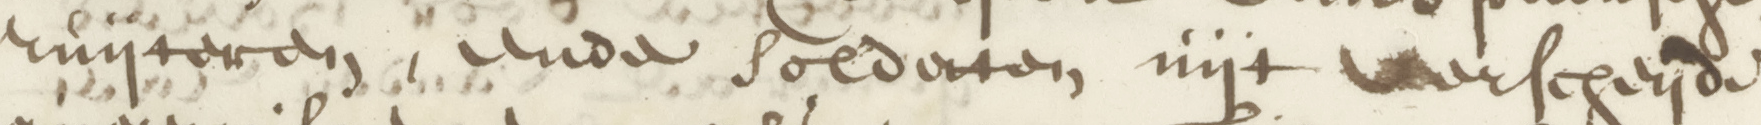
ruijteren, ende soldaten uijt verscheijde
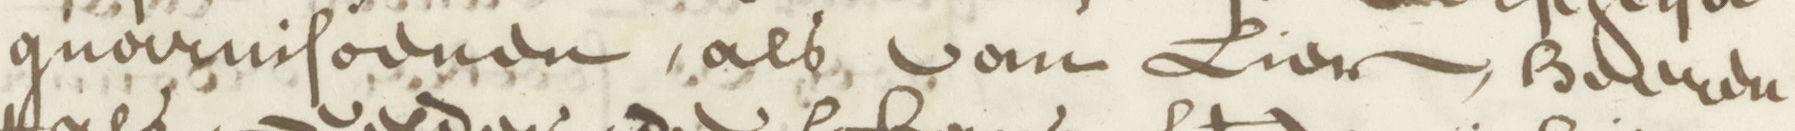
guarnisoenen, als van Lier, Heeren
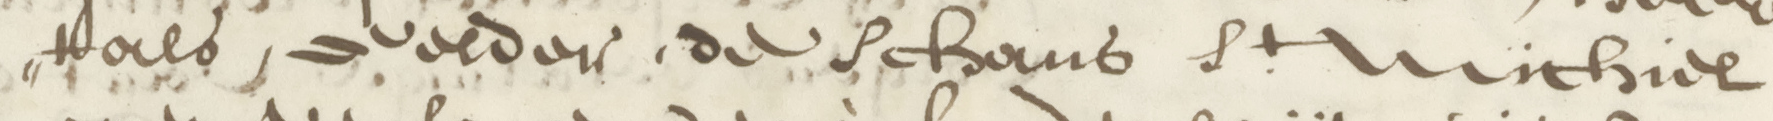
„tals, Gelder, de schans st. Michiel
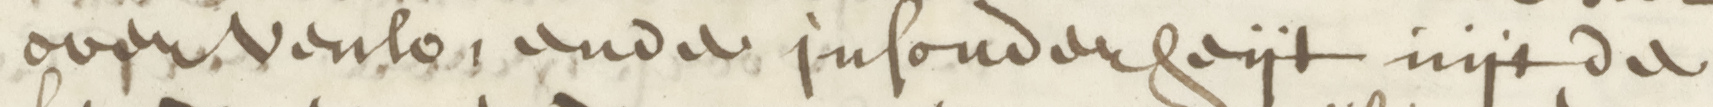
over Venlo, ende insonderheijt uijt de
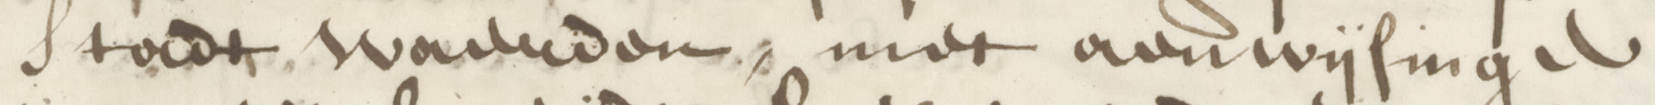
Stadt Waerden, met aenwijsinge
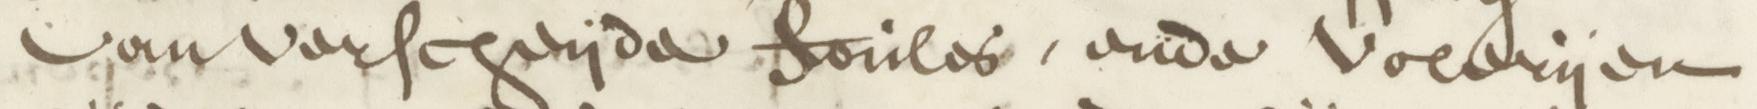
van verscheijde foules, ende Volerijen
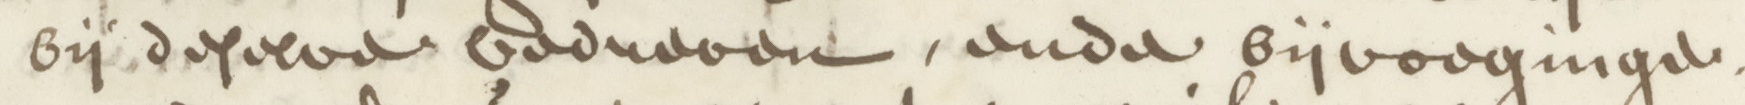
bij deselve bedreven, ende bijvoeginge
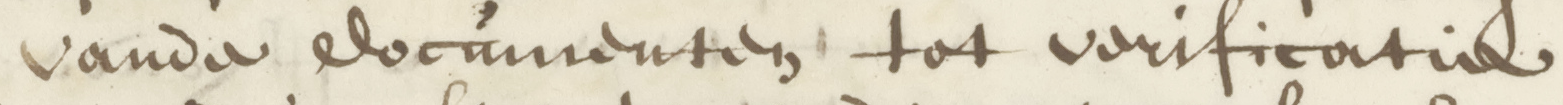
vande documenten tot verificatie
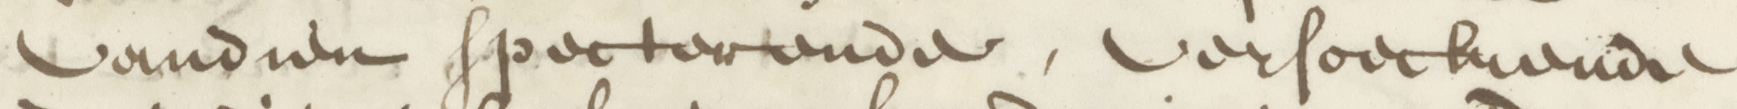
vandien specterende. Versoeckende
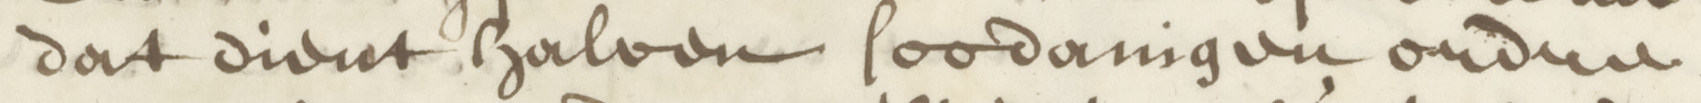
dat dient halven soodanigen ordre
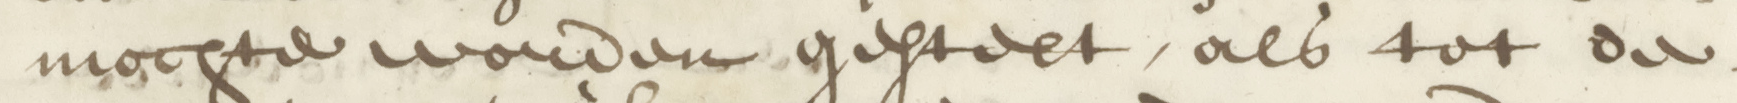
mochte worden gestelt, als tot de
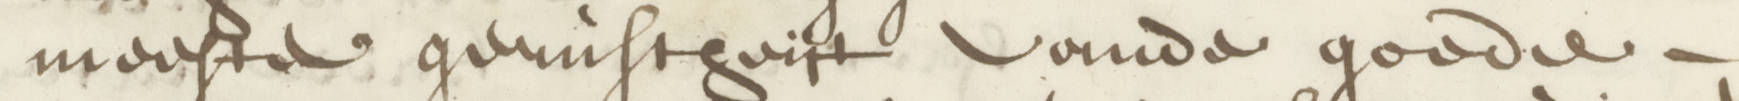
meeste gerustheijt vande goede -
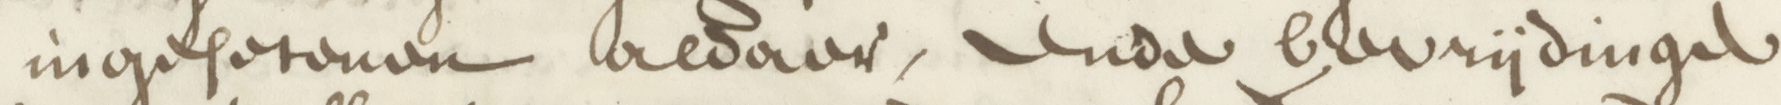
ingesetenen aldaer, Ende bevrijdinge
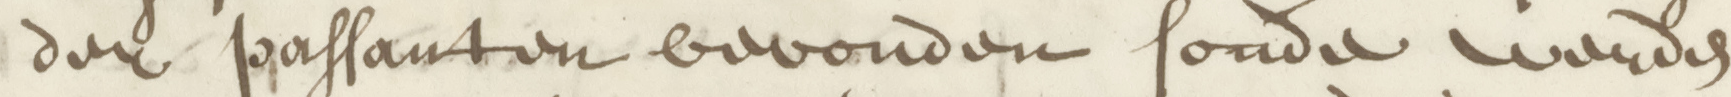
der passanten bevonden soude werden
